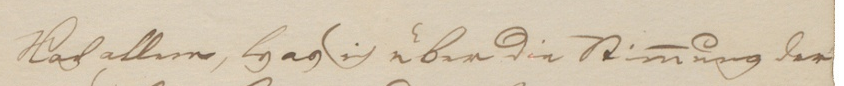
Nach allem, was ich über die Stimmung der
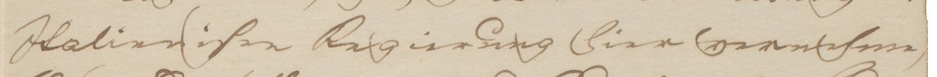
Italienischen Regierung hier vernehme,
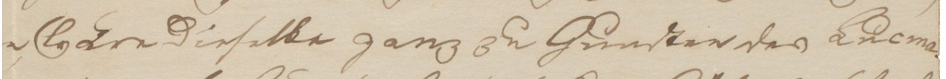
wäre dieselbe ganz zu Gunsten des Lucma-
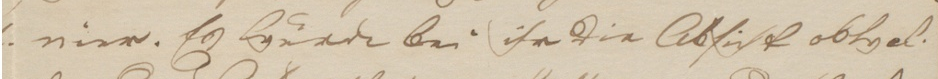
nier. Es würde bei ihr die Absicht obwal-
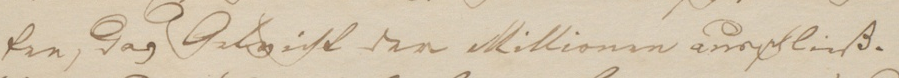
ten, das Gewicht der Millionen auschließ-
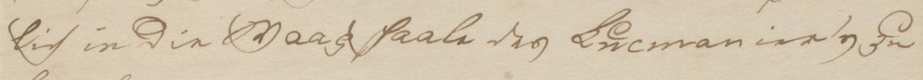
lich in die Waagschaale des Lucmanier's zu
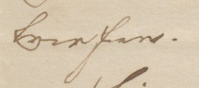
werfen.
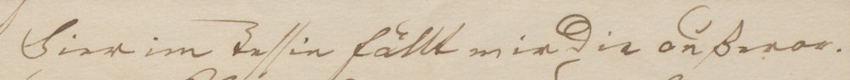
Hier im Tessin fällt mir die außeror-
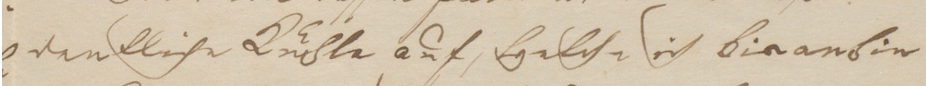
dentliche Kühle auf, welche ich bisanhin
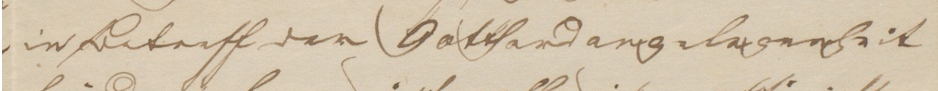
in Betreff der Gotthardangelegenheit
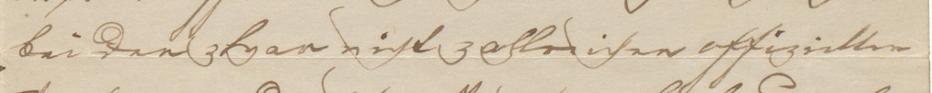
bei den zwar nicht zahlreichen offiziellen
